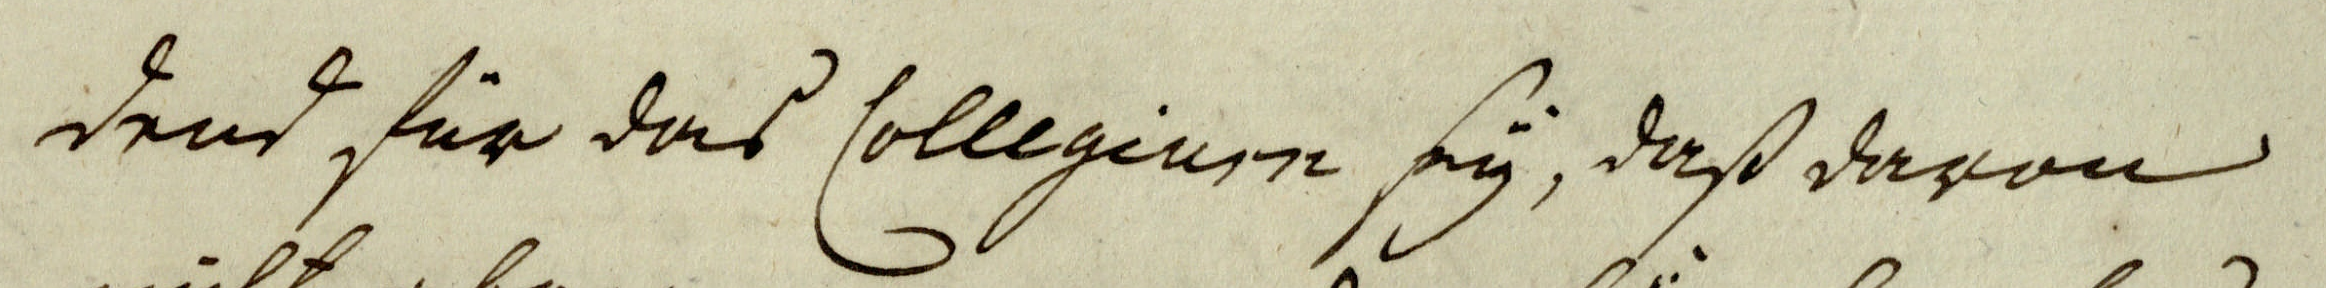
dend für das Collegium seÿ, daß davon
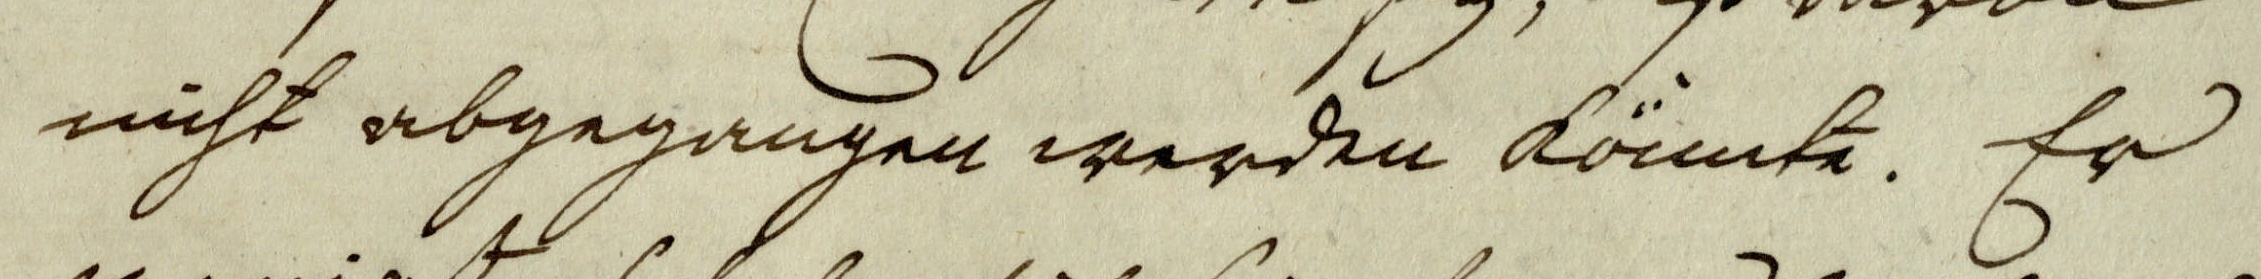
nicht abgegangen werden könnte. Er
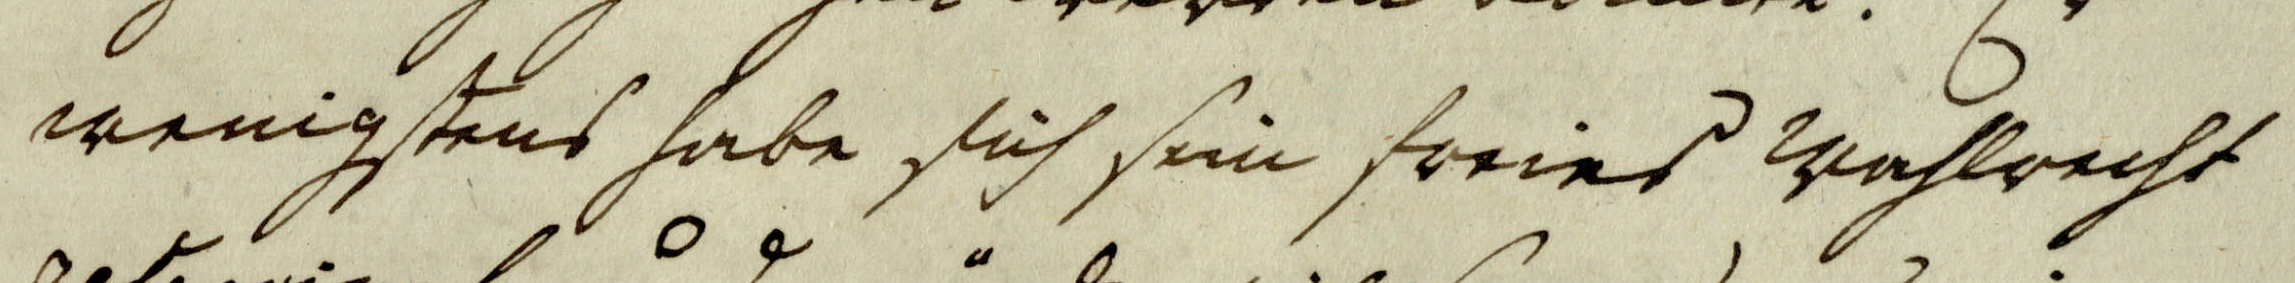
wenigstens habe sich sein freies Wahlrecht
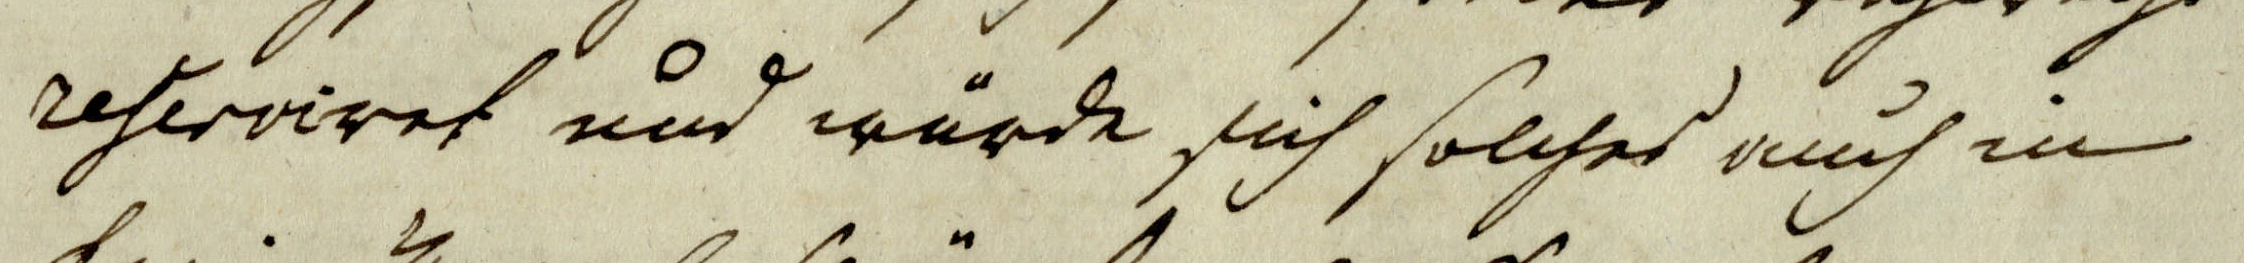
reserviret und würde sich solches auch in
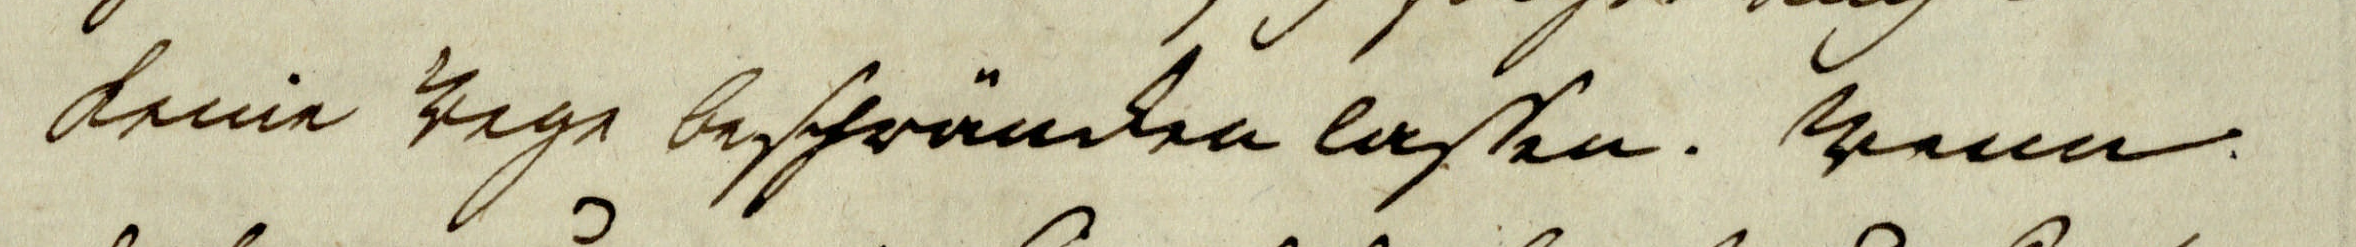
keine Wege beschräncken lassen. Wenn
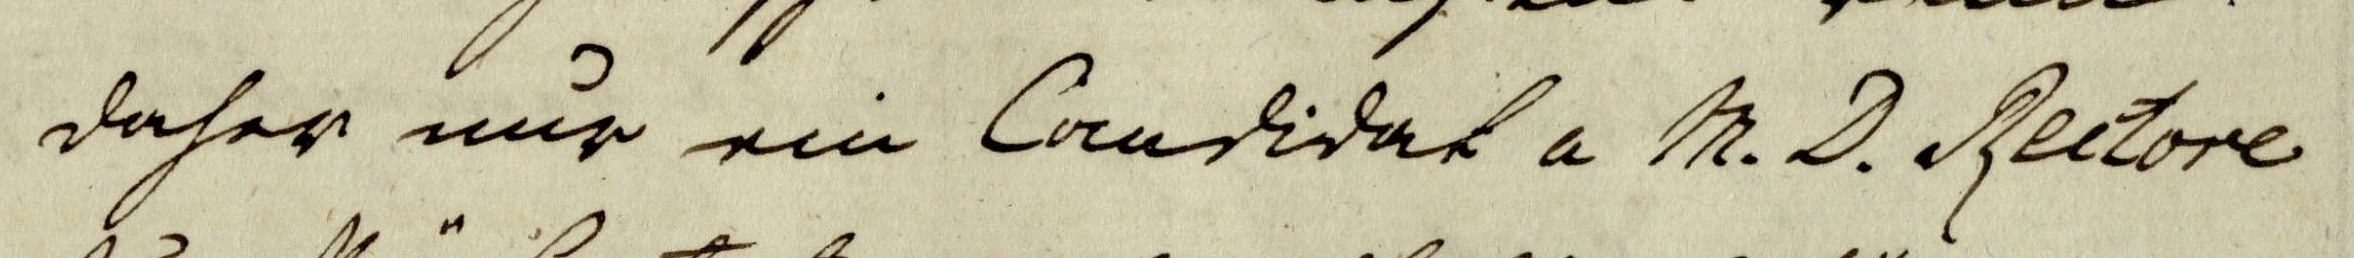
daher nur ein Candidat a M. D. Rectore
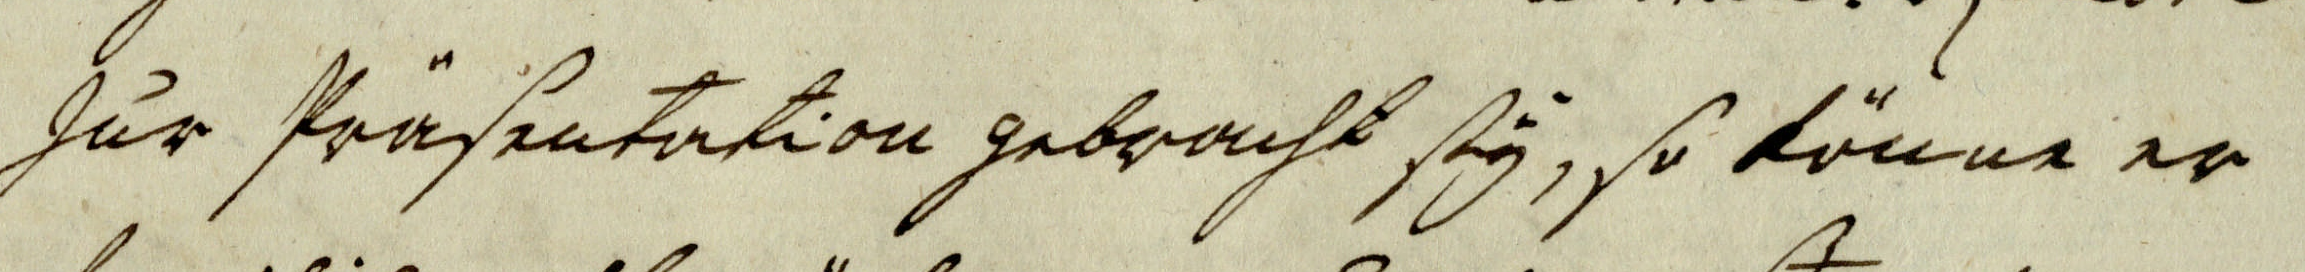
zur Präsentation gebracht seÿ, so könne er
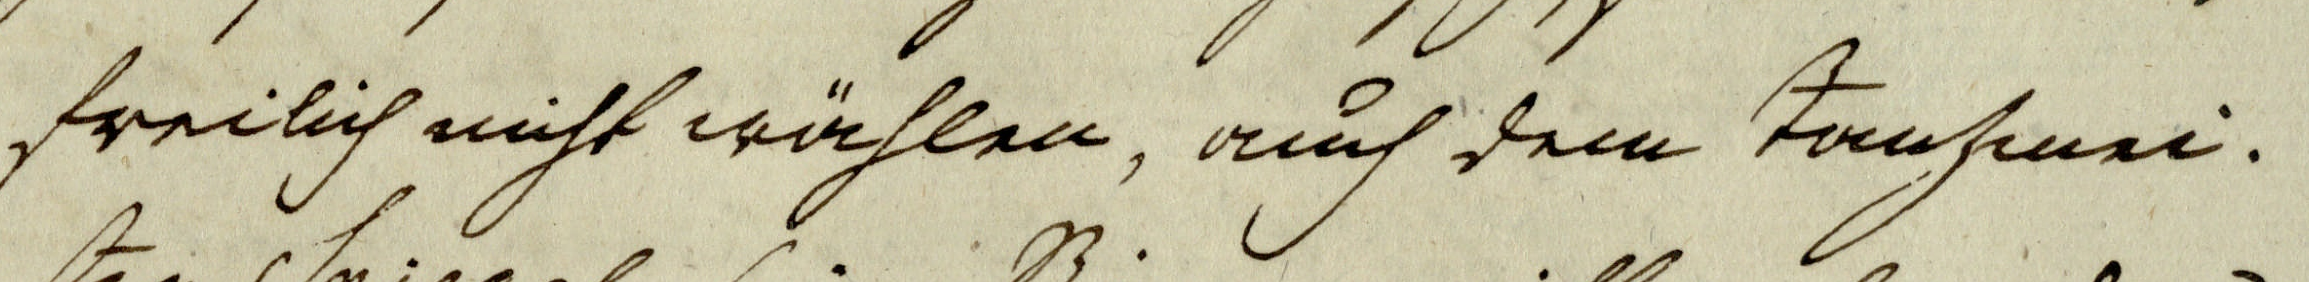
freilich nicht wählen, auch dem Tanzmei¬
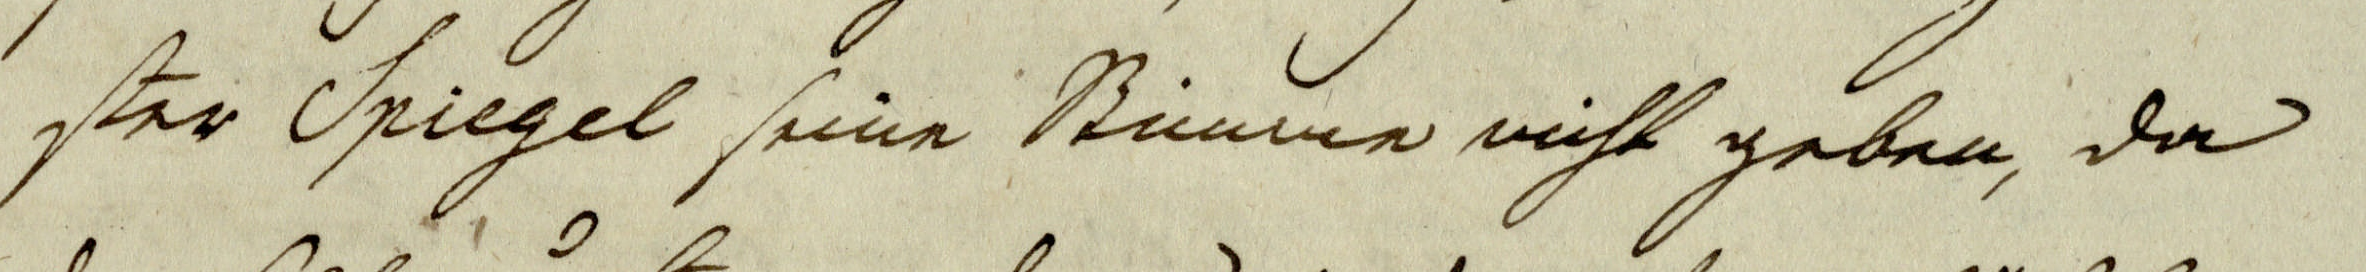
ster Spiegel seine Stimme nicht geben, da
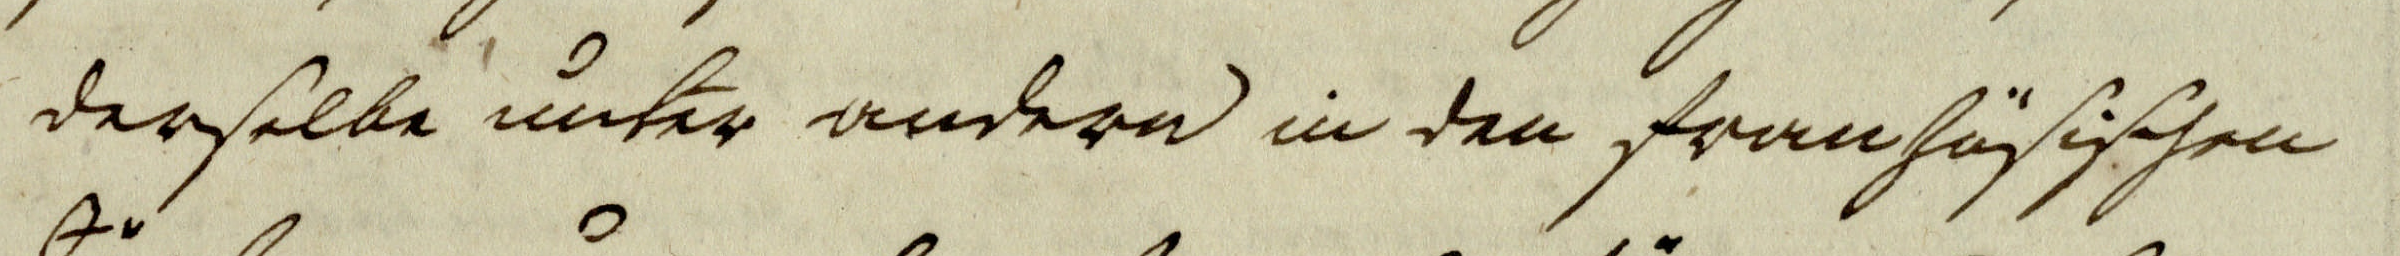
derselbe unter andern in den französischen
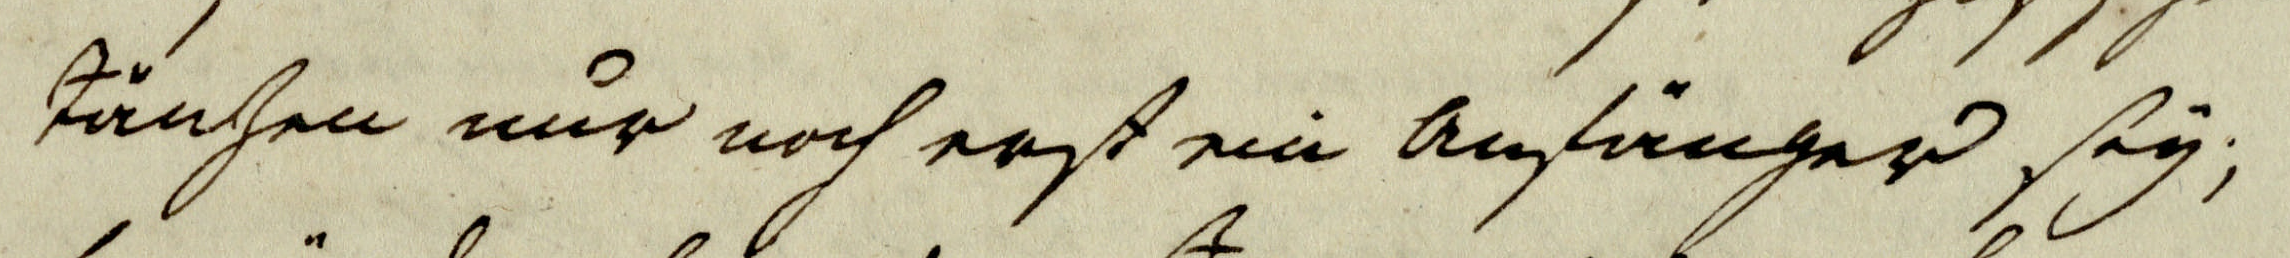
Tänzen nur noch erst ein Anfänger seÿ;
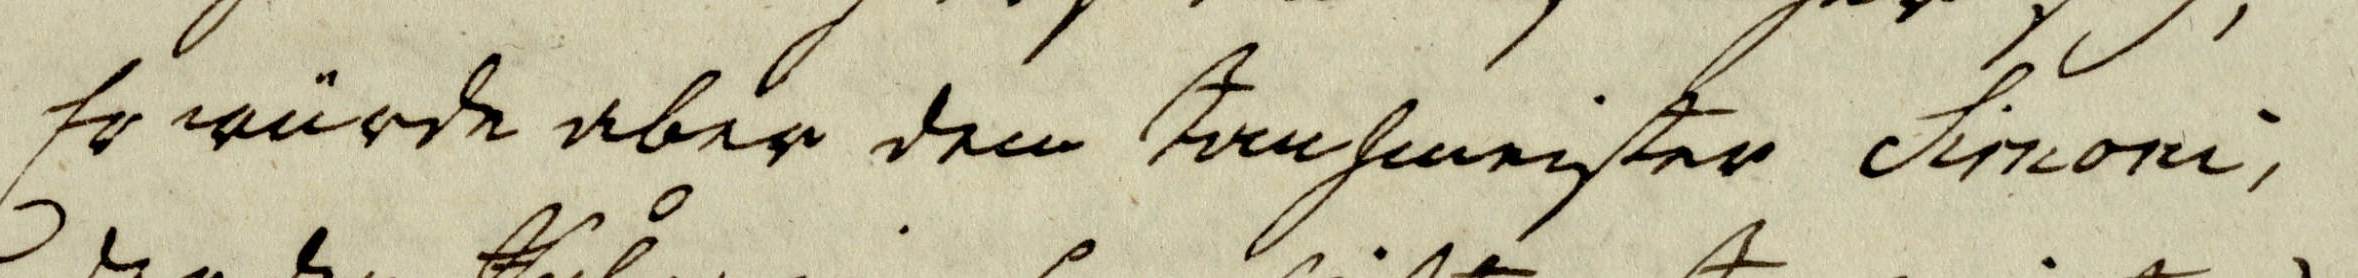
Er würde aber dem Tanzmeister Simoni,
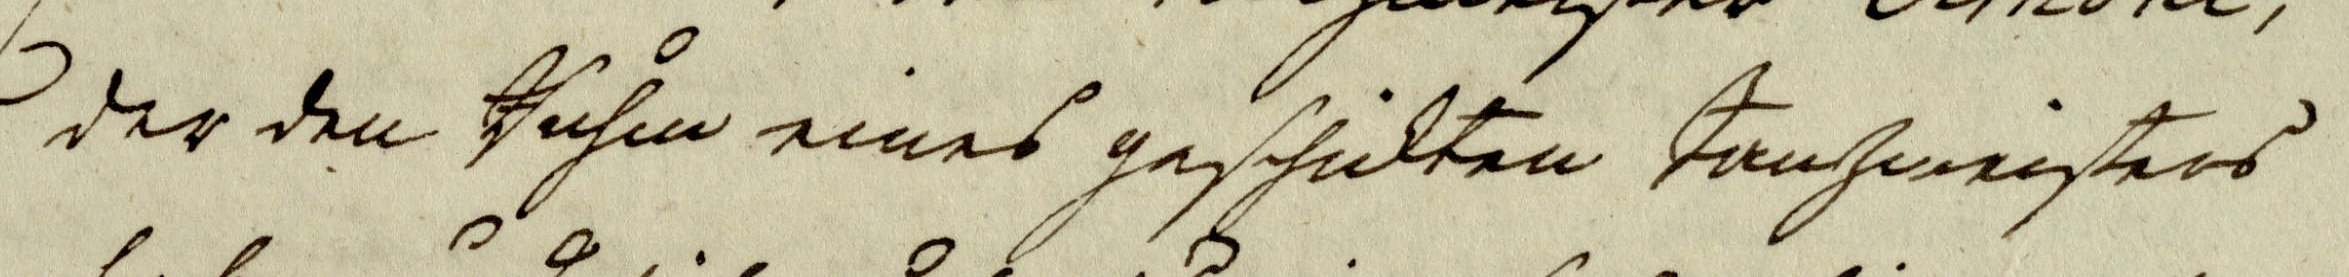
der den Ruhm eines geschickten Tanzmeisters
